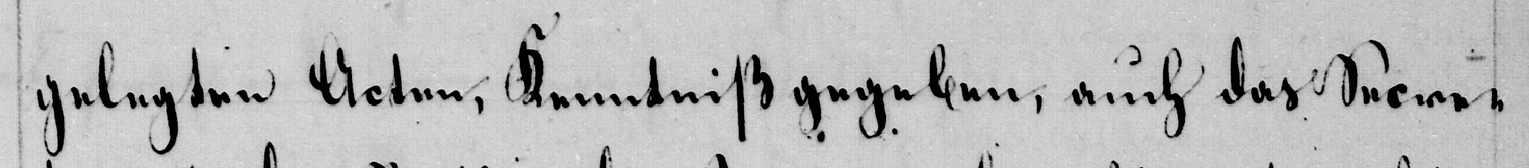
gelegten Acten, Kenntniß gegeben, auch das Secre¬
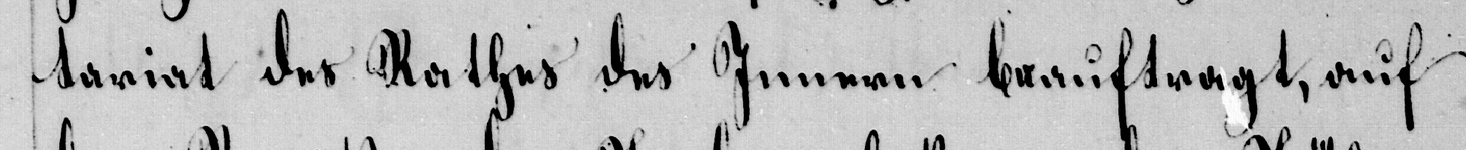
tariat des Rathes des Innern beauftragt, auf
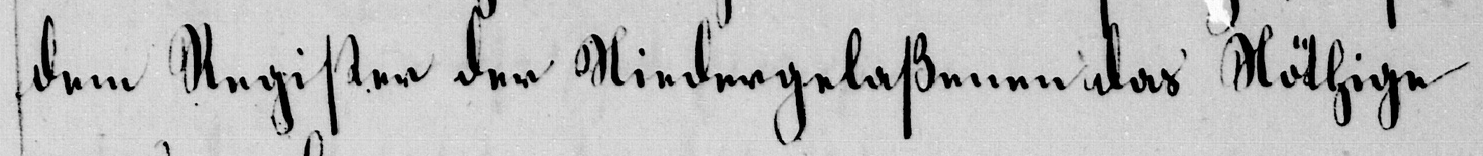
dem Register der Niedergelaßenen das Nöthige
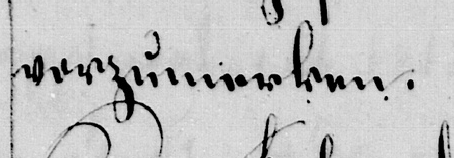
vorzumerken.
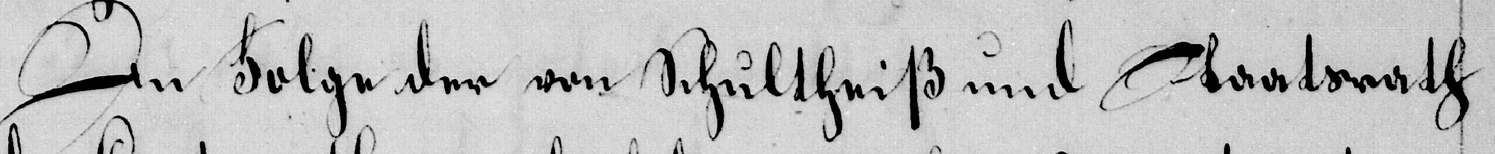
In Folge der von Schultheiß und Staatsrath
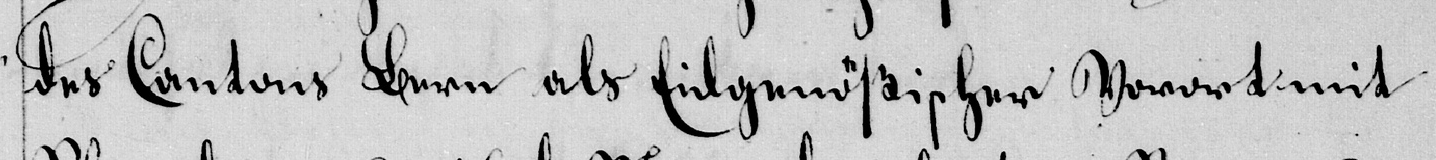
des Cantons Bern als Eidgenößischer Vorort mit
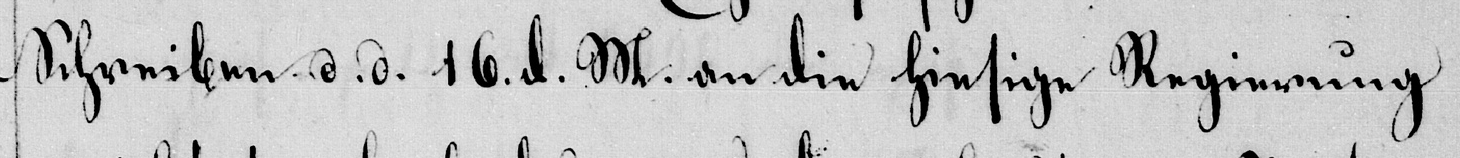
Schreiben d. d. 16. d. M. an die hiesige Regierung
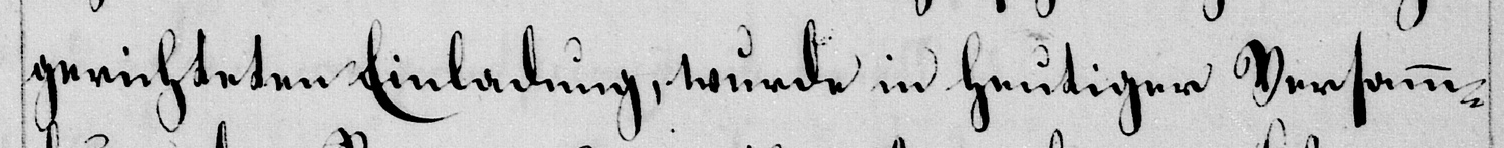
gerichteten Einladung, wurde in heutiger Versamm¬
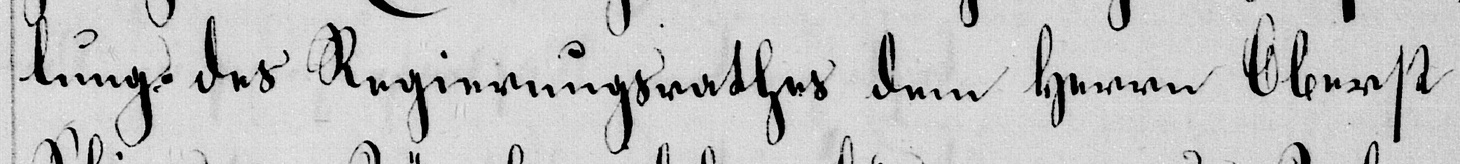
lung des Regierungsrathes dem Herrn Oberst
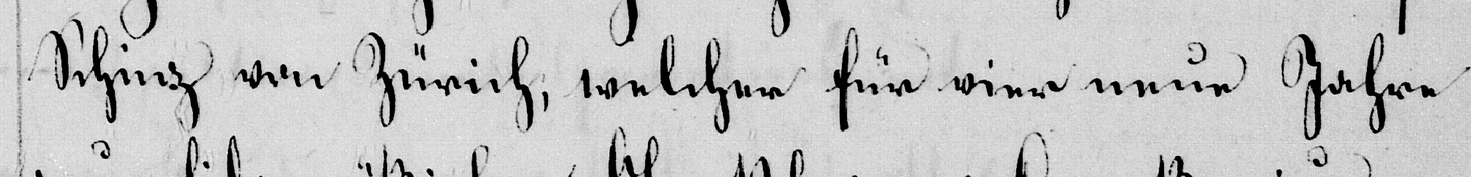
Schinz von Zürich, welcher für vier neue Jahre
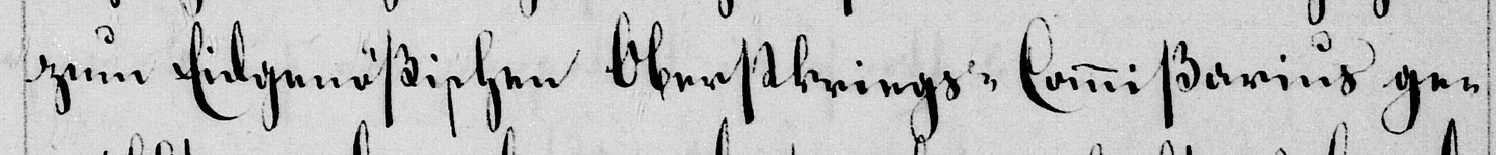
zum Eidgenößischen Oberstkriegs-Commißarius ge¬
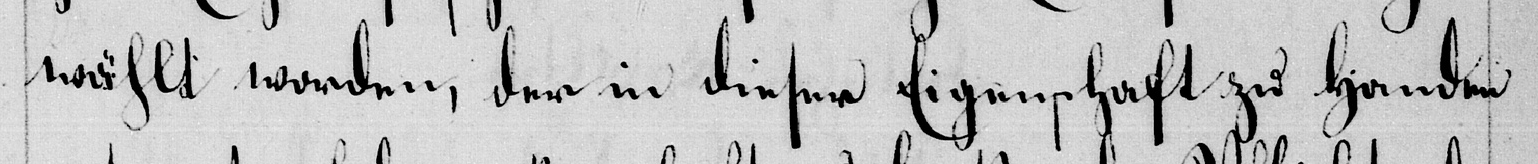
wählt worden, der in dieser Eigenschaft zu Handen
